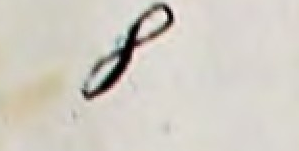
8
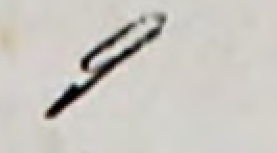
9
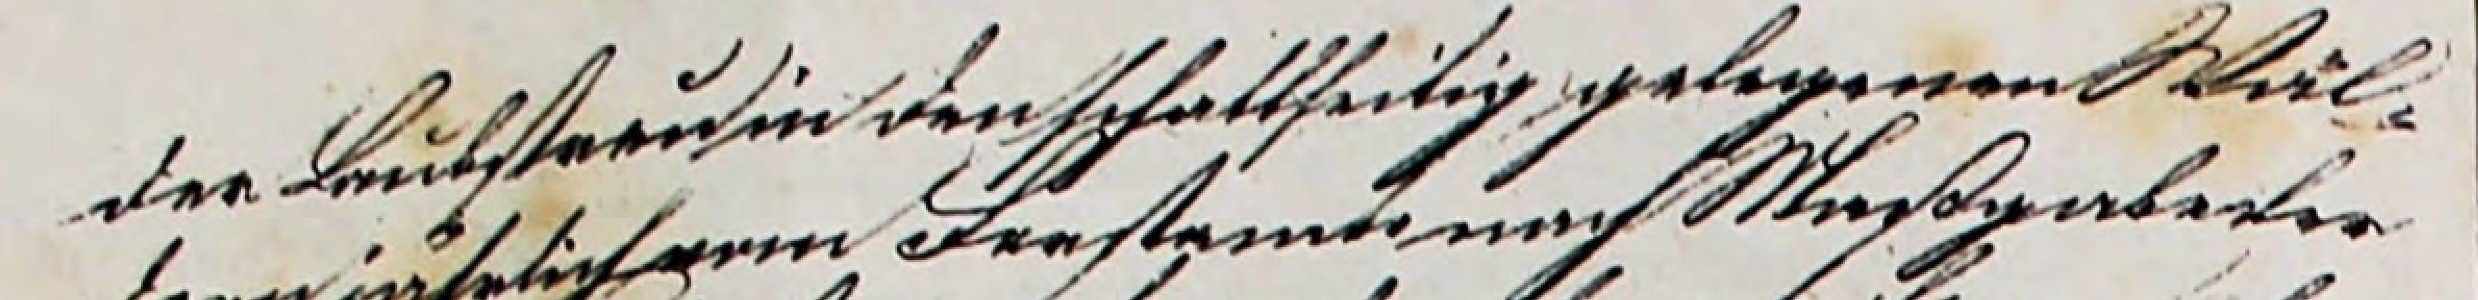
der Laubstreu in den schattseitig gelegenen Wäl„
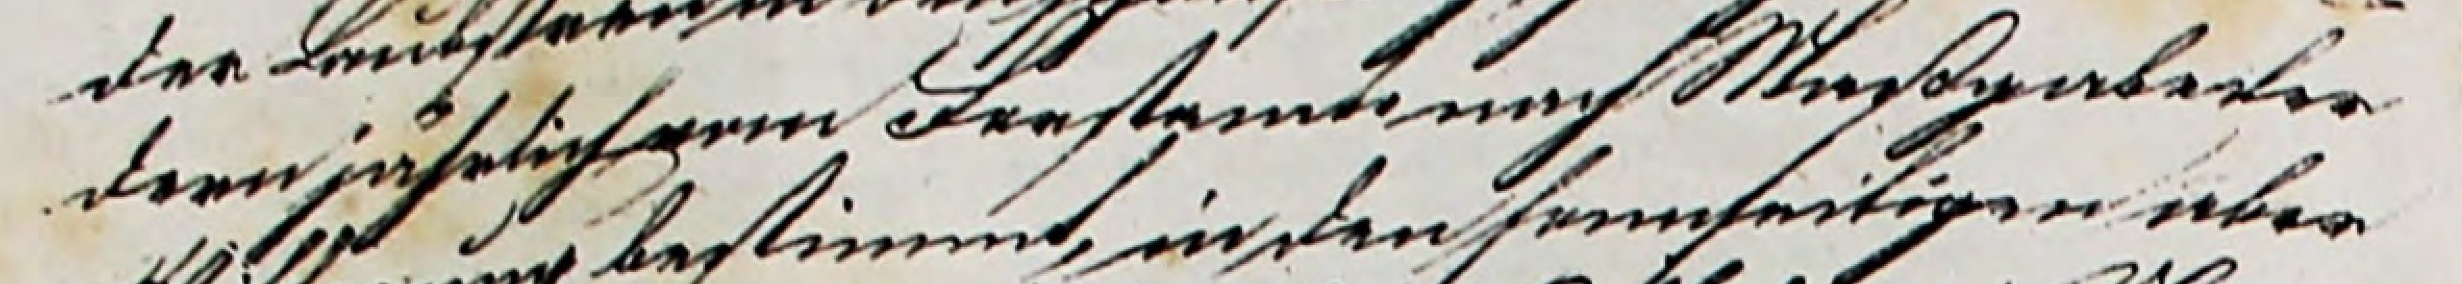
dern jährlich vom Ferstamer nach Mastgabe?er
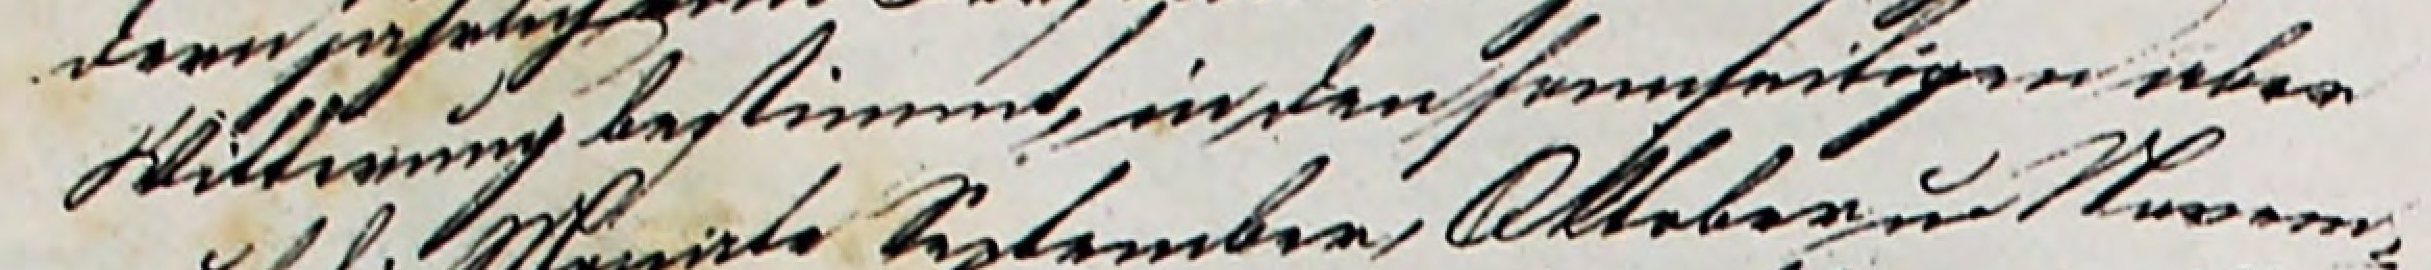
Witterung bestimmt, in den sennseitigen aber
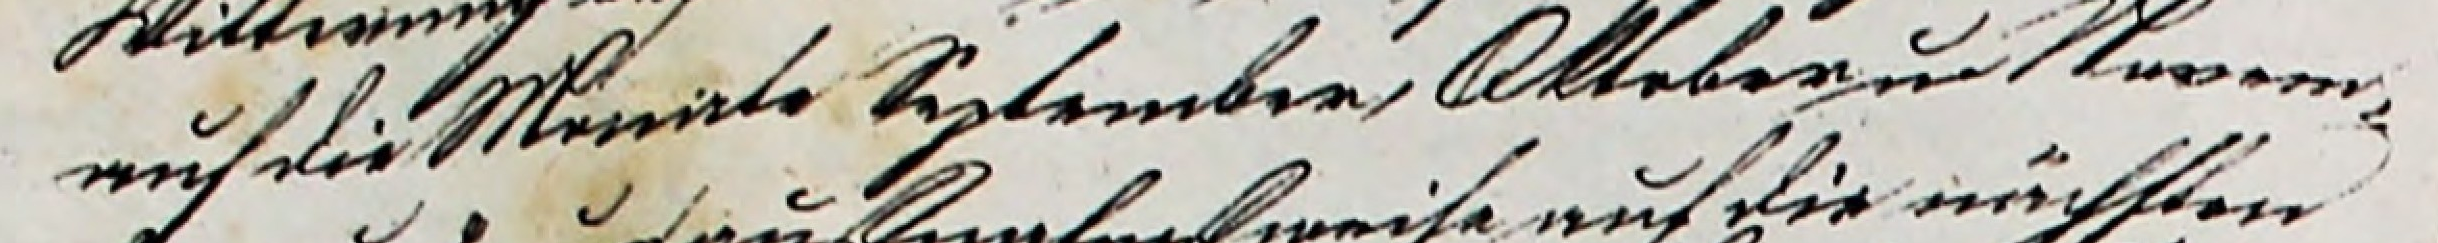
auf die Monate September Oktober u. Novem„
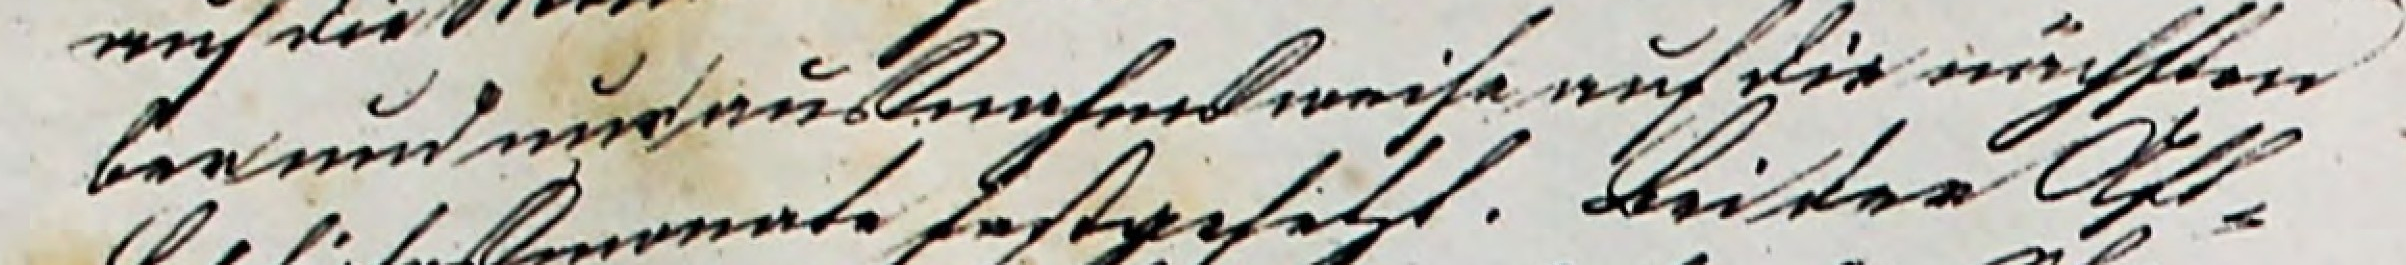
ber und nur ausnahmsweise auf die nächsten
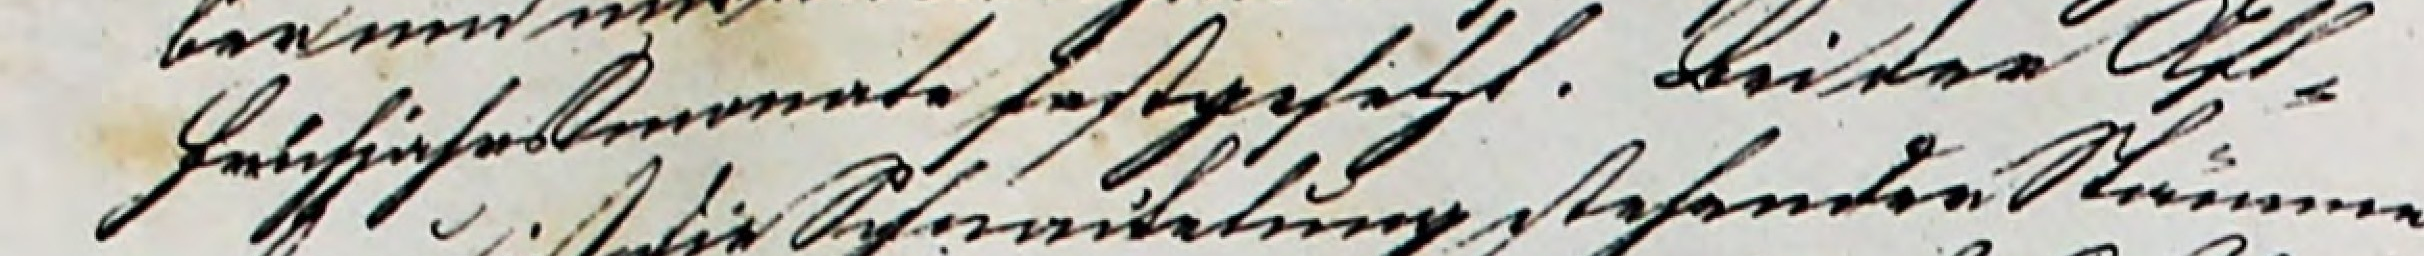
Frühjahrsmonate festgesetzt. Bei der Aft„
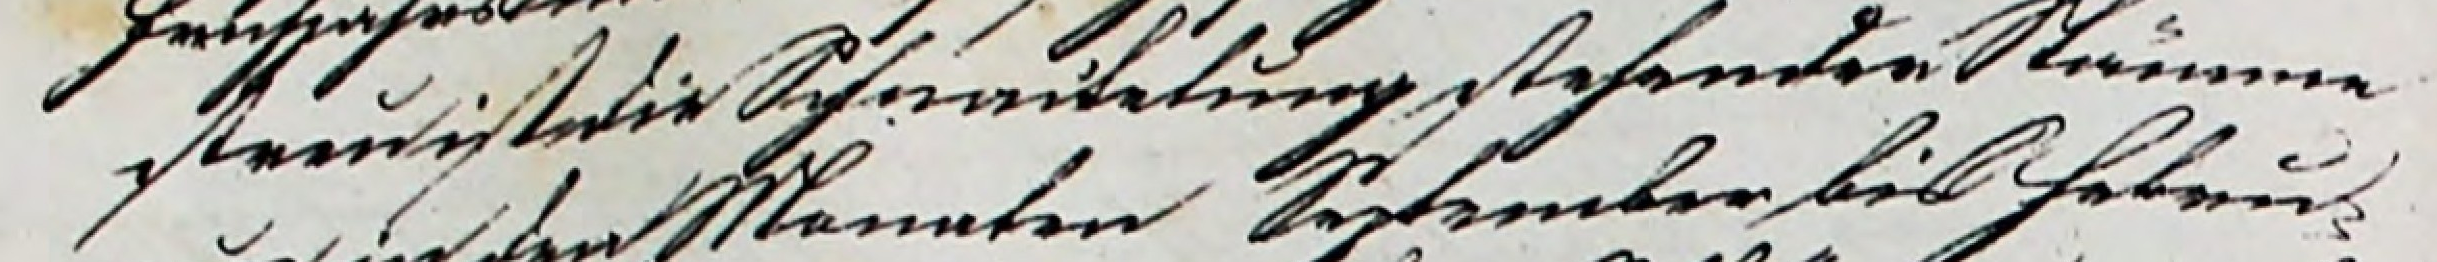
streu ist die Schnautelung stehenden Stämme
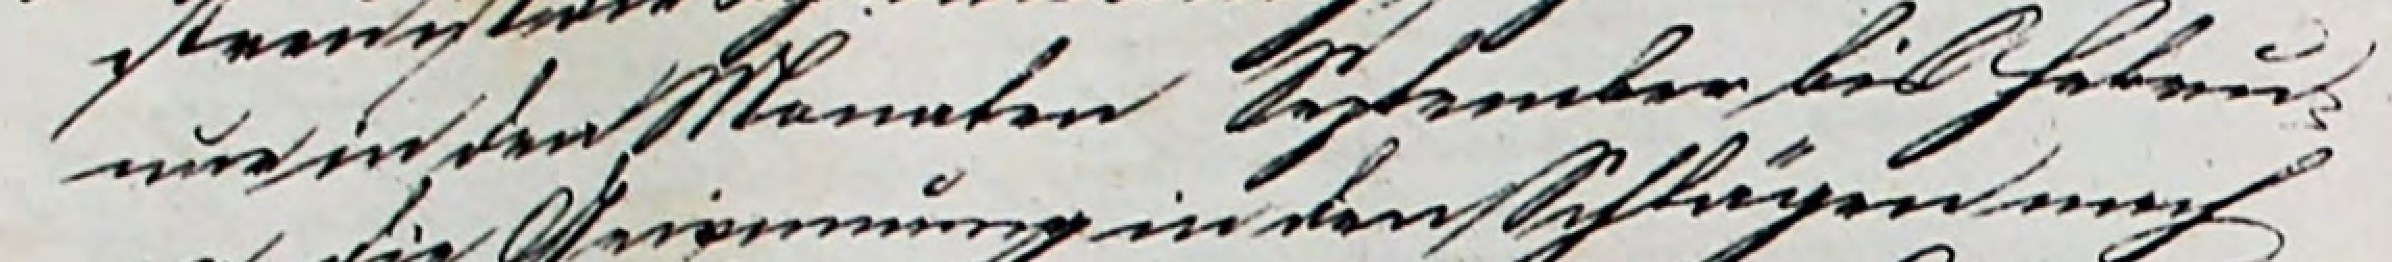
nur in den Monaten September bis Febru„
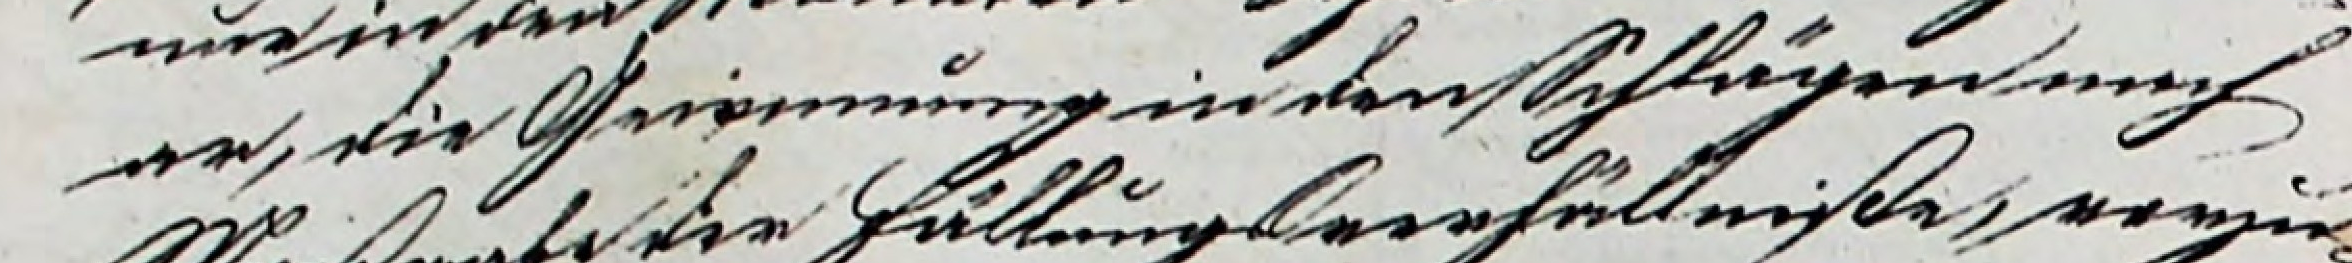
ar, die Gerinnung in den Schlägen nach
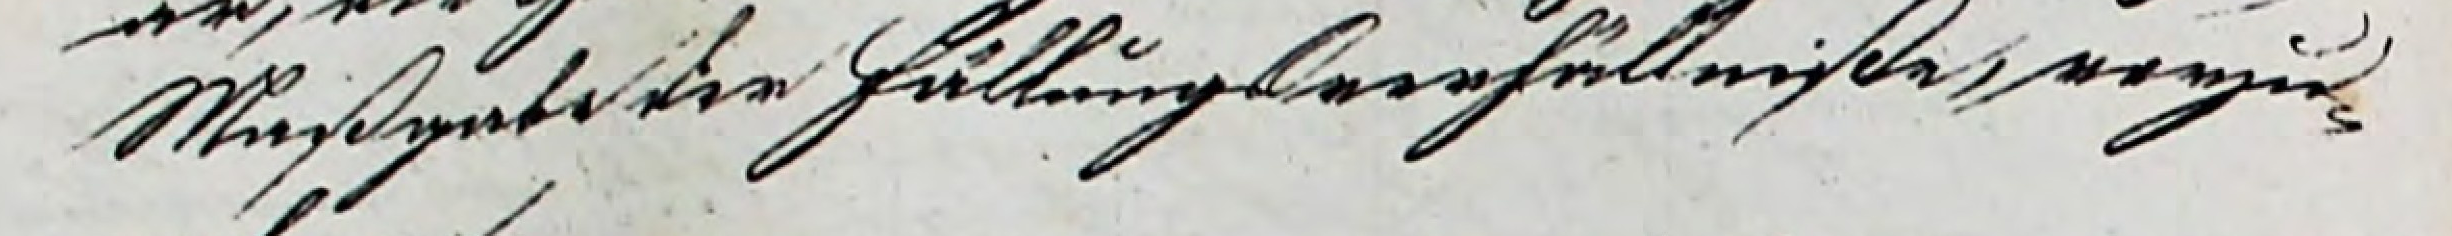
Mastgabe der Fällungsverhältniße, vorzu„
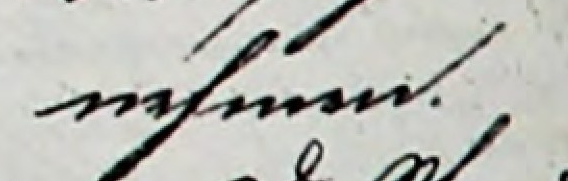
nehmen.
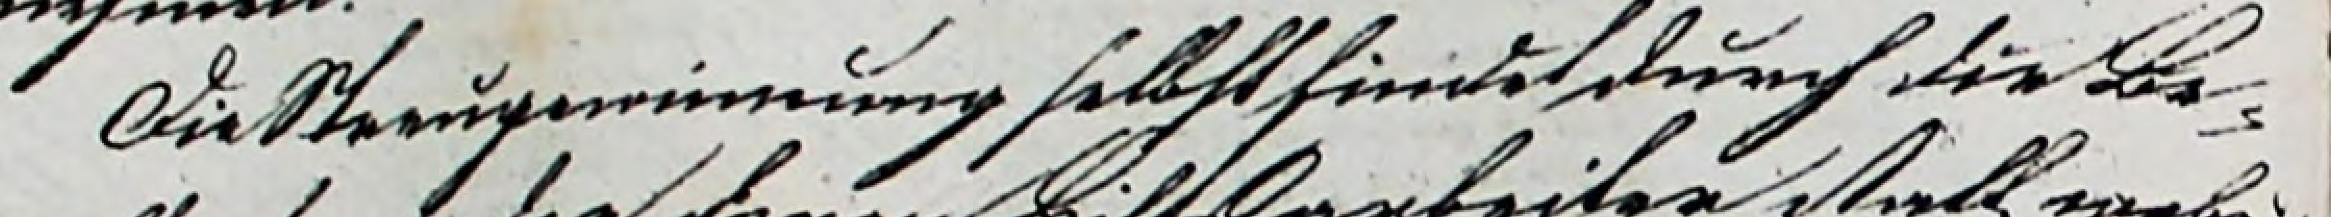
Die Streugewinnung selbst findet durch die Be„
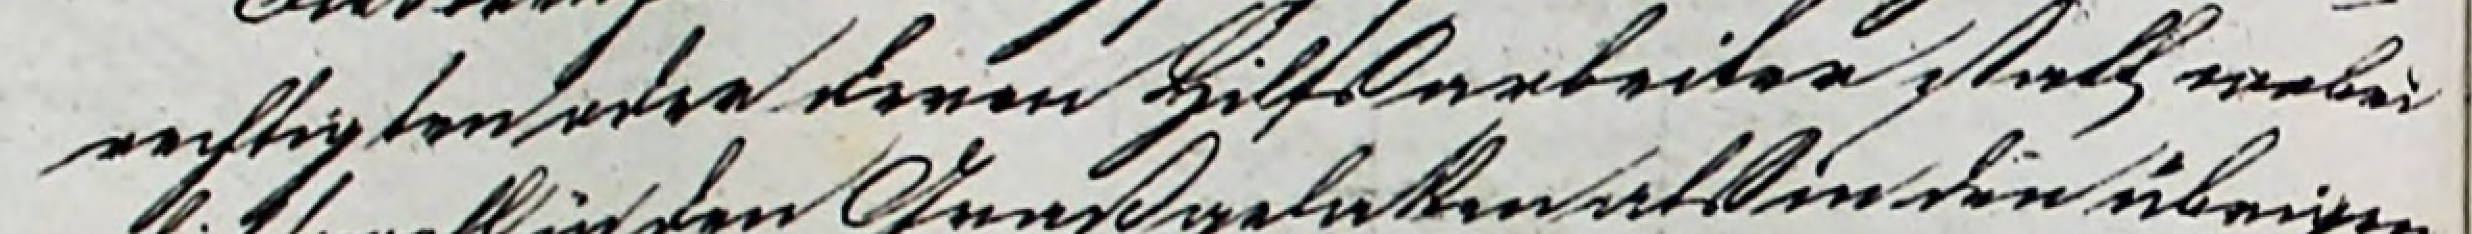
rechtigten oder deren Hilfsarbeiter statt wobei
